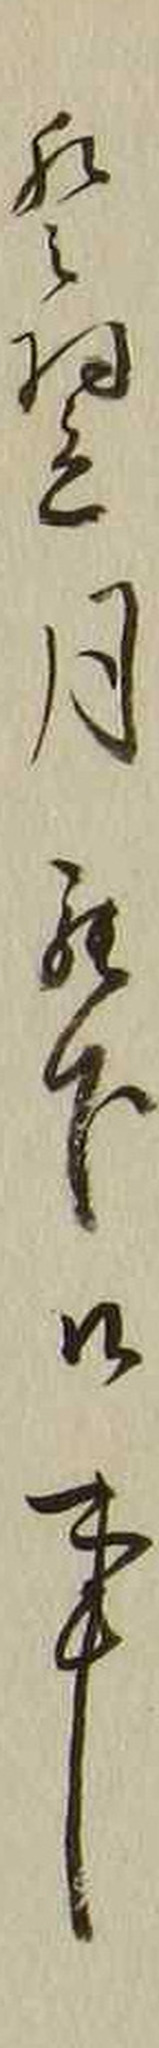登翌月罷下候事
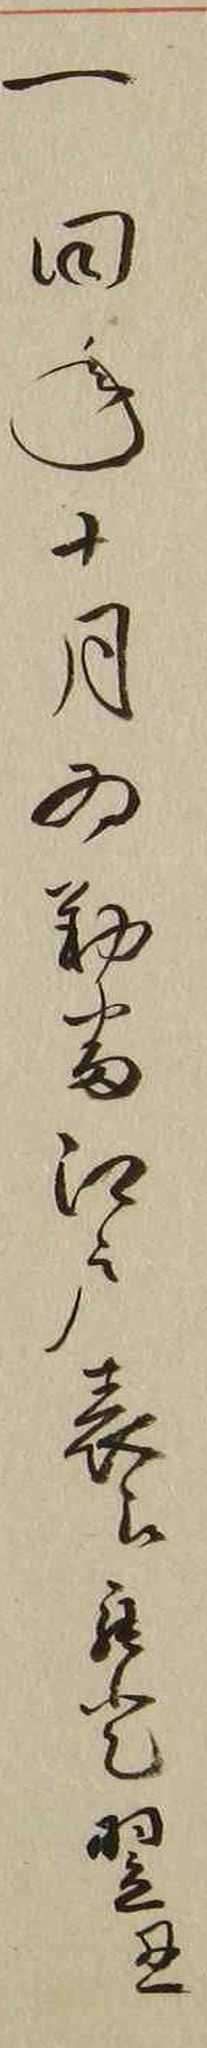一同年十月為勤番江戸表江罷登翌丑
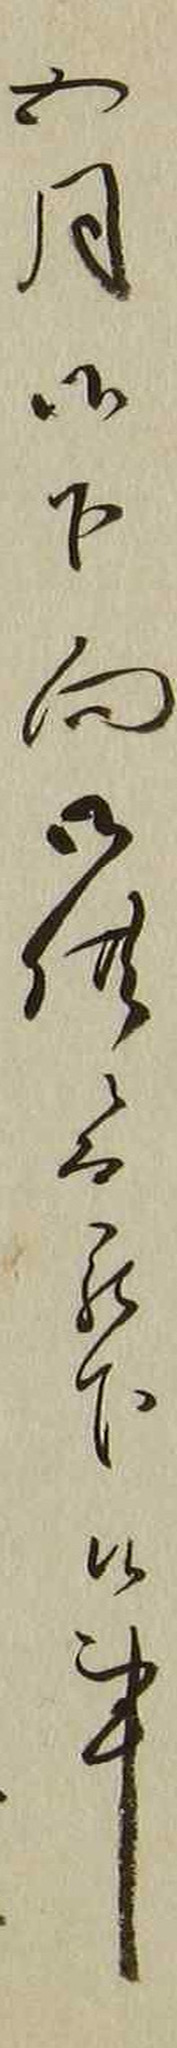五月御下向御供に而罷下候事
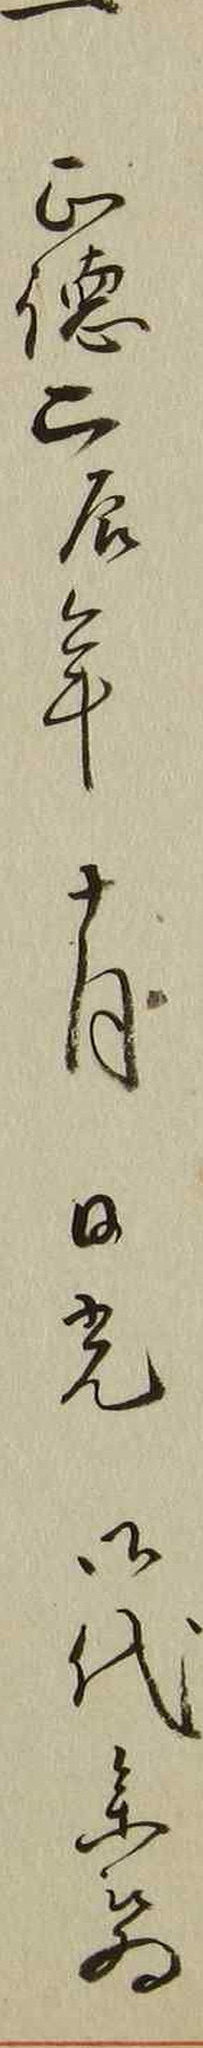一正徳二辰年十月日光御代参被為
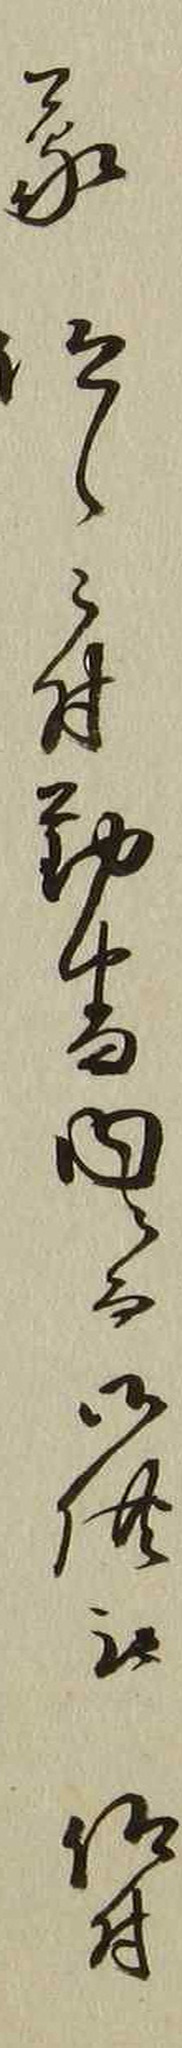蒙仰候に付勤番内に而御供被仰付
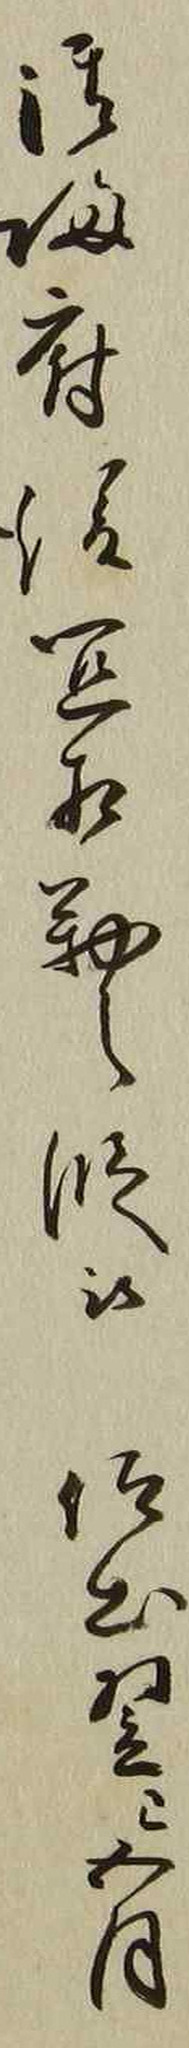御帰府後宜相勤候段被仰出翌巳五月
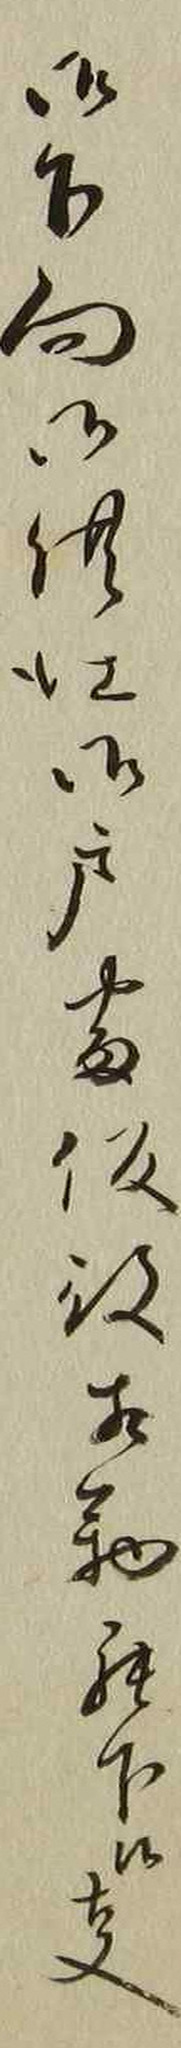御下向御供仕御戸番仮役相勤罷下候事
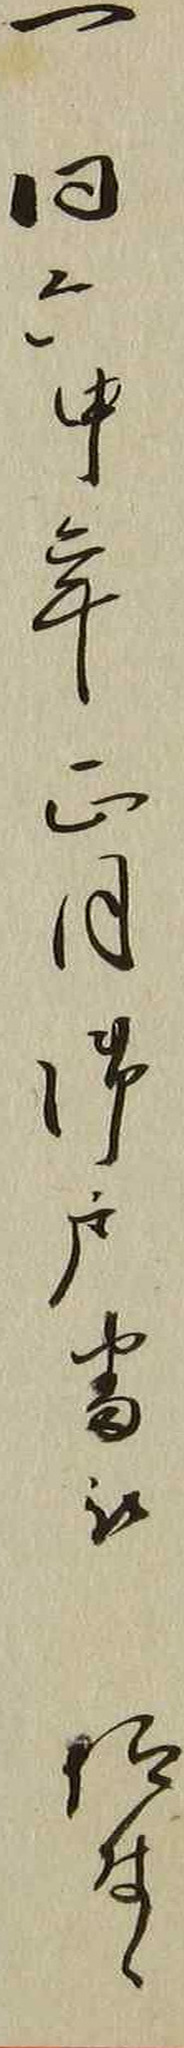一同六申年正月御戸番被仰付候
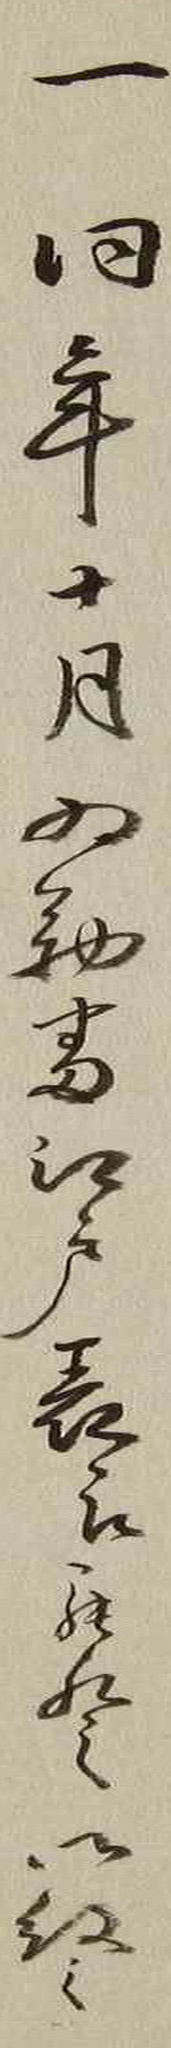一同年十月為勤番江戸表江罷登御紋之
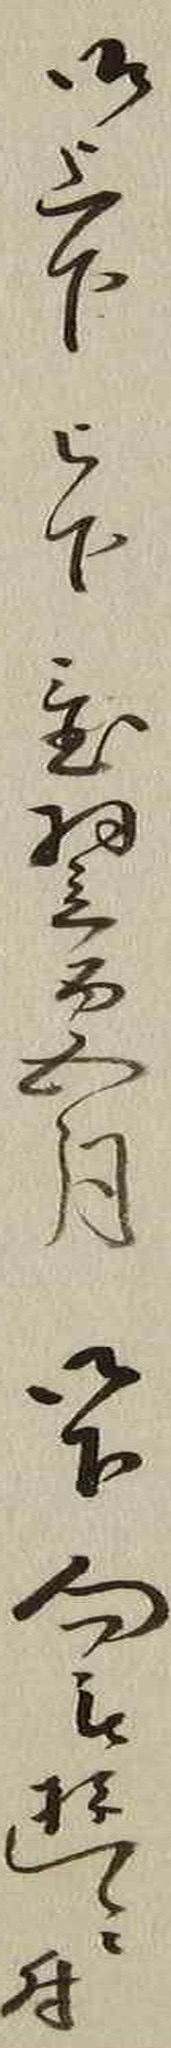御上下被下置翌酉五月御下向被遊候に付
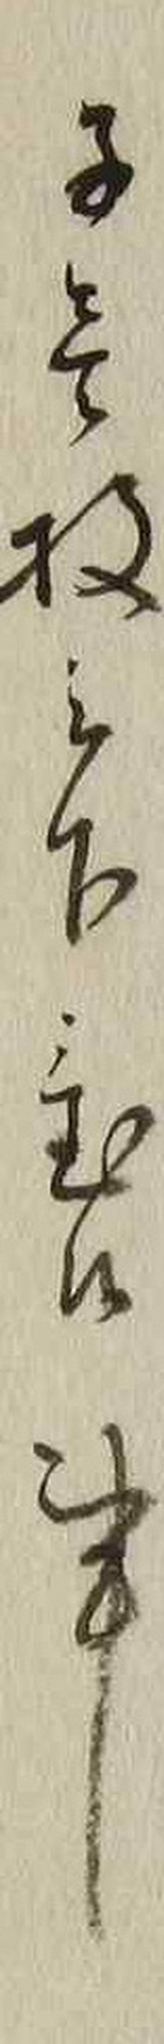子壱枚被下置候事
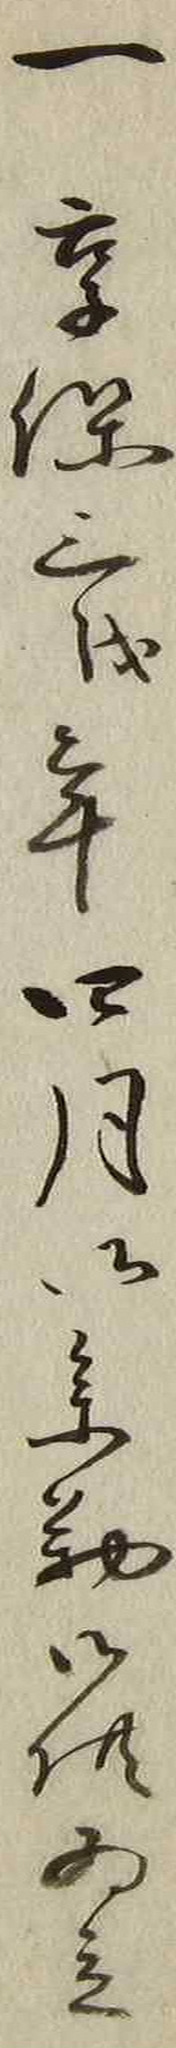一享保三戌年四月御参勤御供為立
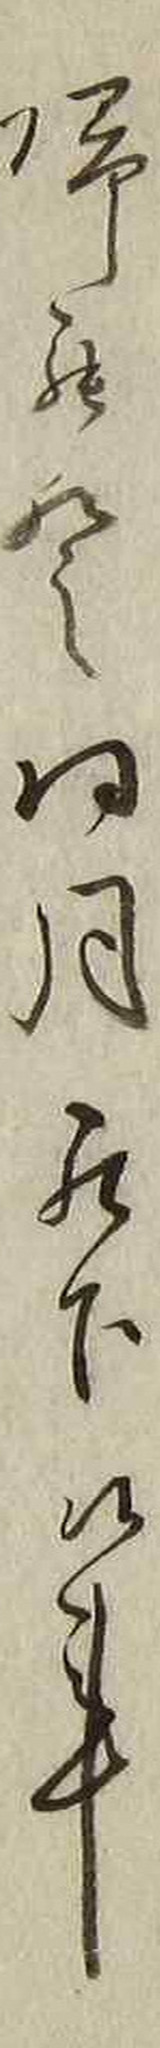帰罷登同月罷下候事
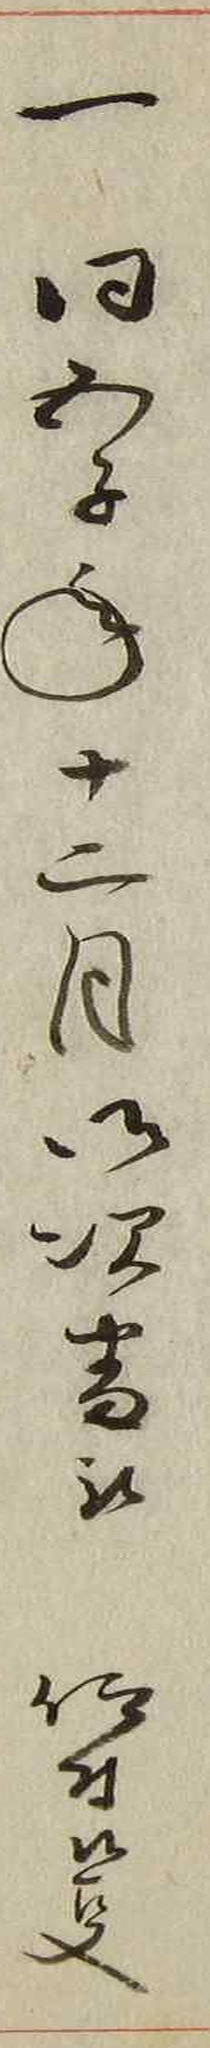一同五子年十二月御次番被仰付候事
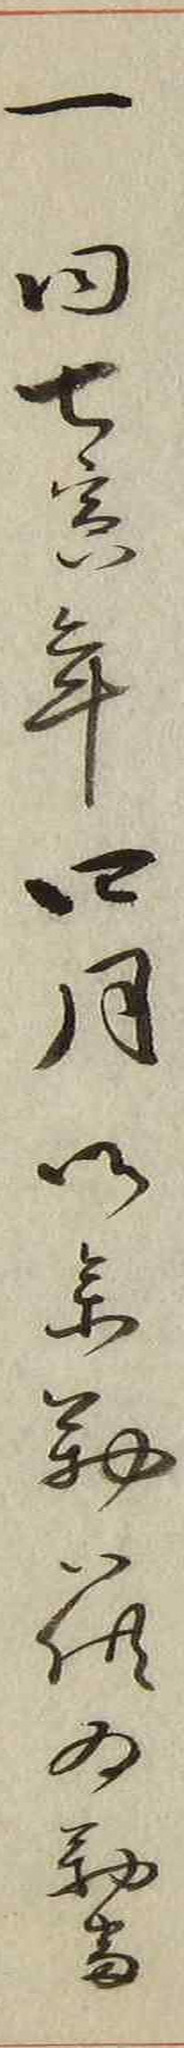一同七寅年四月御参勤御供為勤番
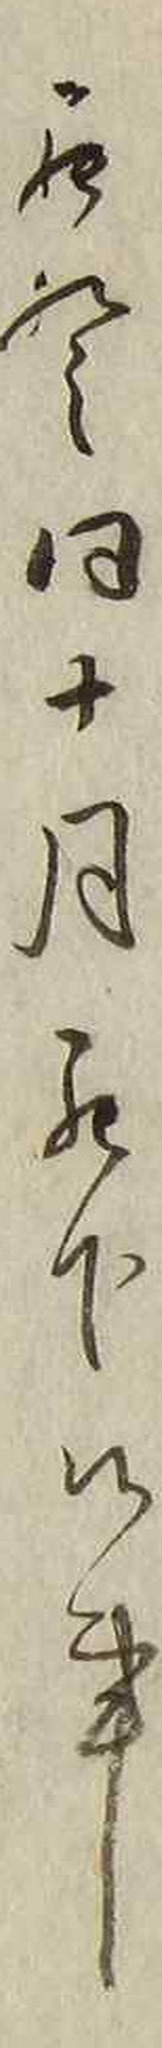罷登同十月罷下候事
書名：諸士系譜　巻之3　い之部3
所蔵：会津若松市立会津図書館
